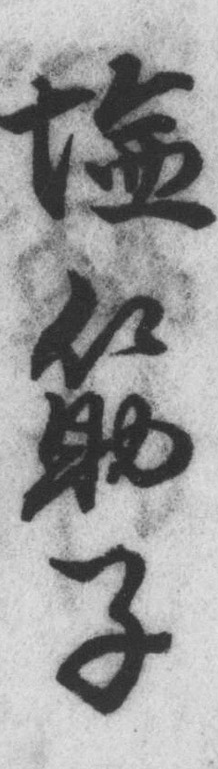塩筋子
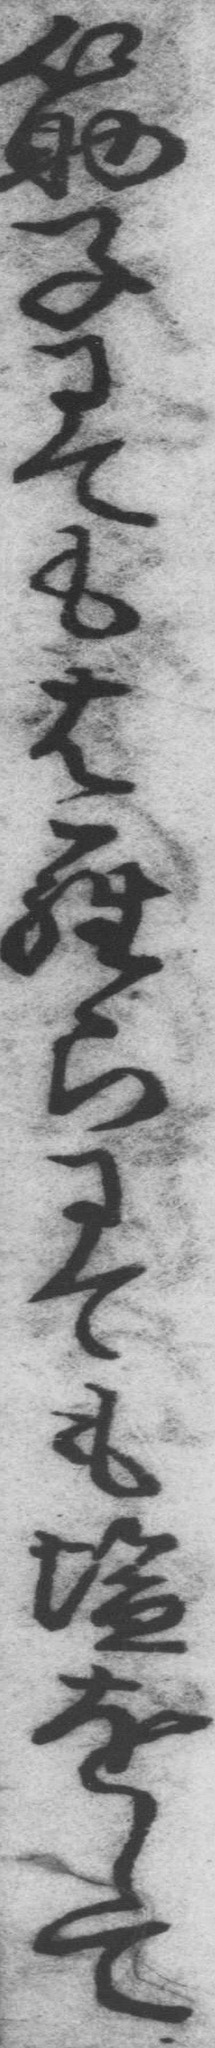筋子にてもはららにても塩をして

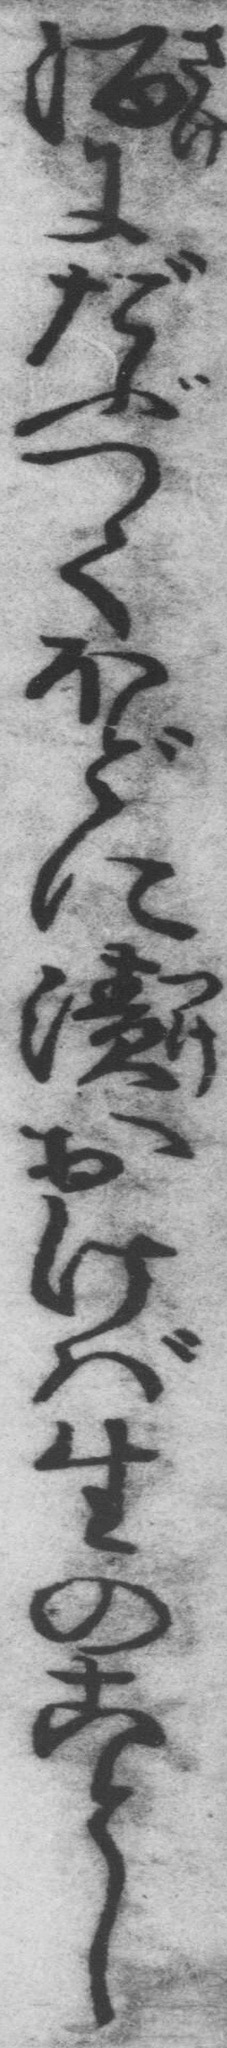酒にだぶつくほどに漬おけば生のことし
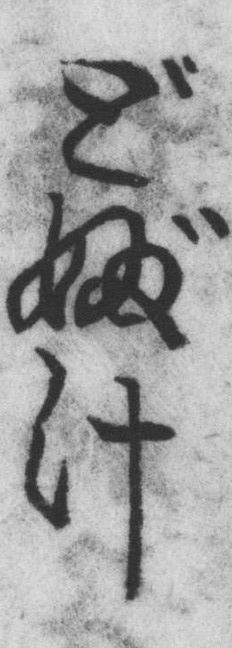どぶ汁
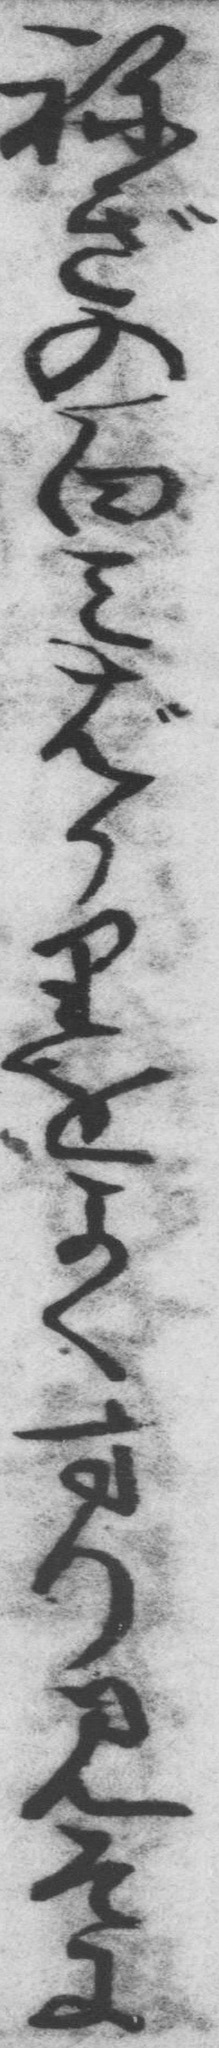ねぎの白みばかりをよくすりみそに
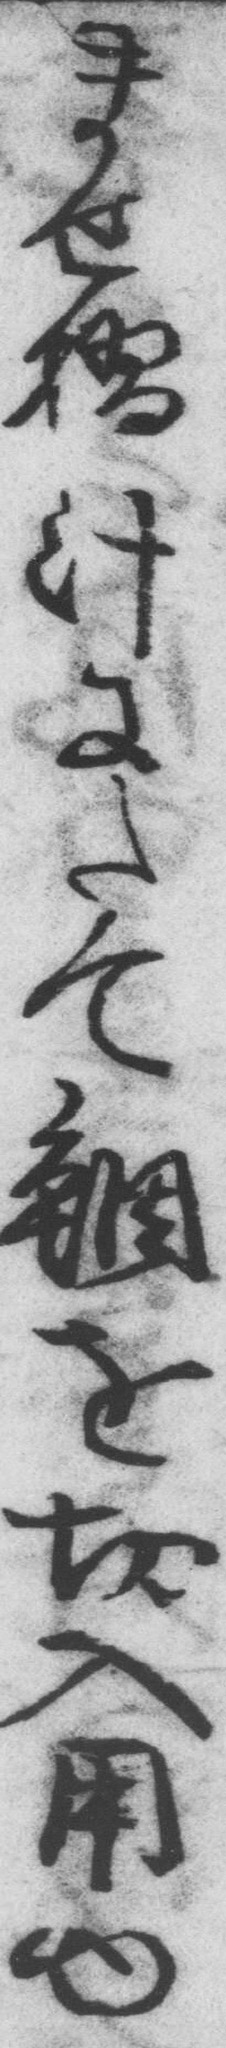ませ摺汁にたて鯛を切入用ゆ
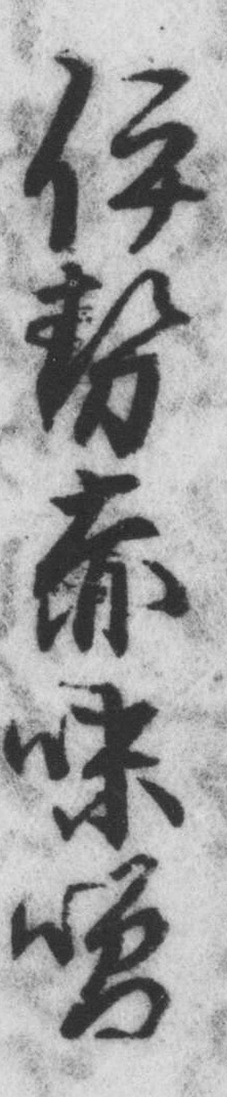伊勢赤味噌
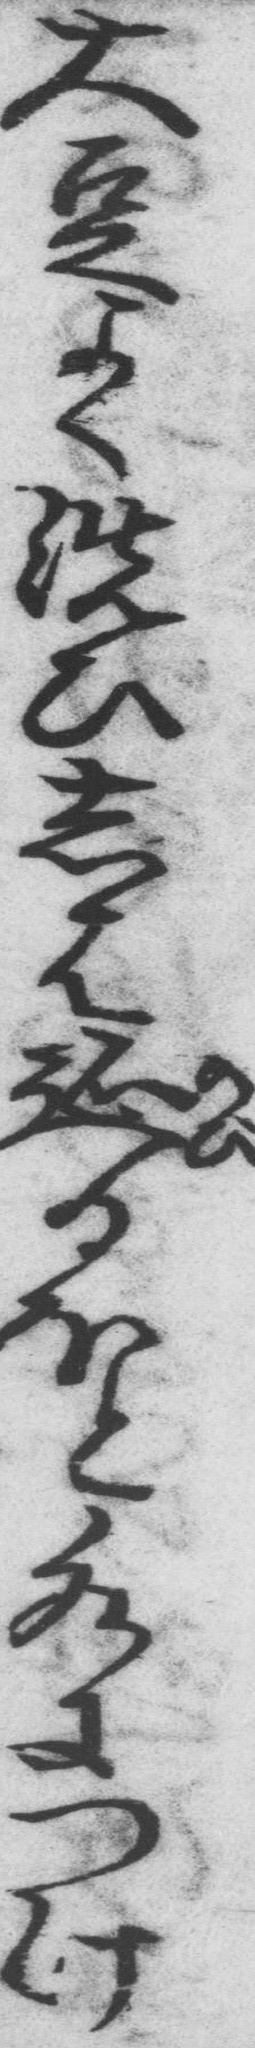大豆よく洗ひしは延るほと水につけ
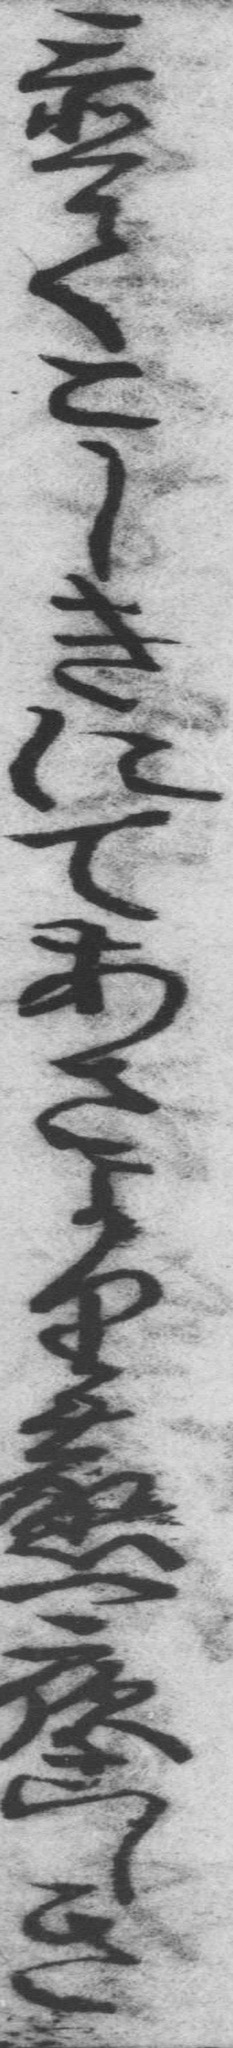置てこしきにてあさより蒸一夜こしき
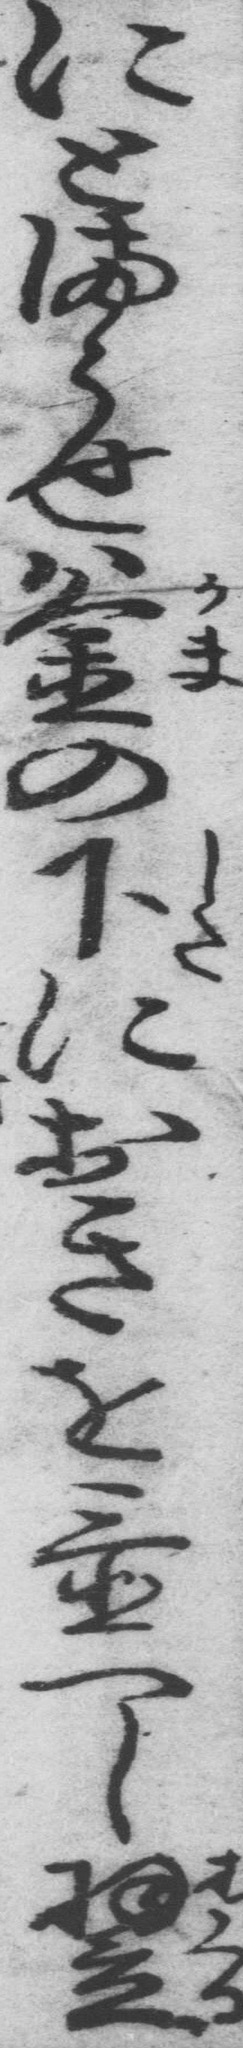にとまらせ釜の下におきを置へし翌
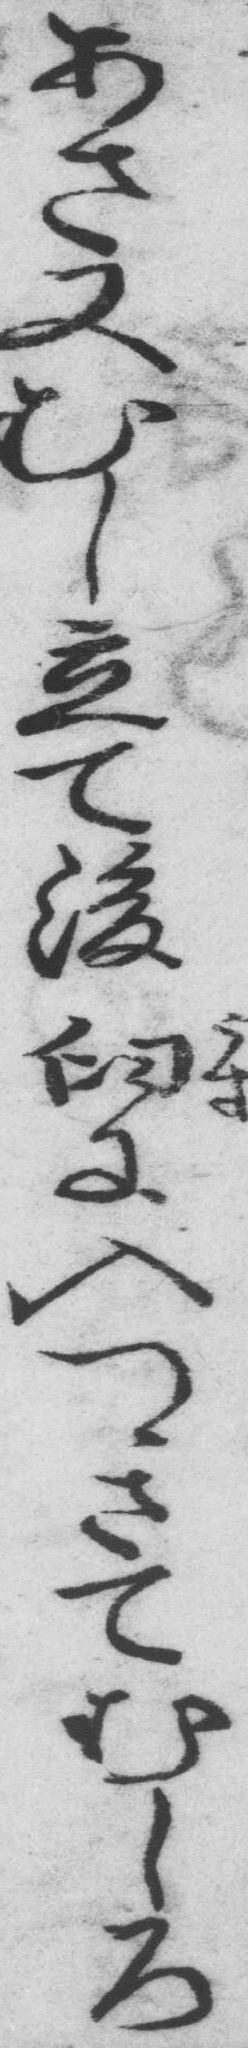あさ又むし立て後臼に入つきてむしろ
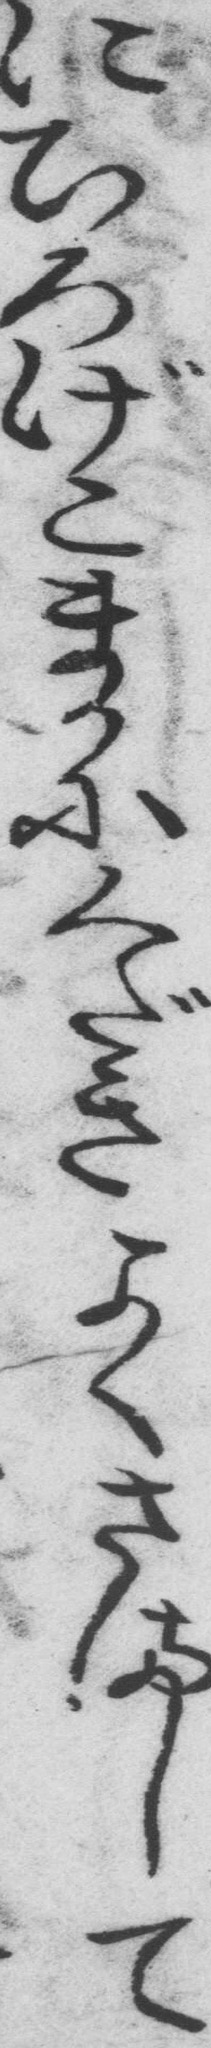にひろげこまかにくだきよくさまして
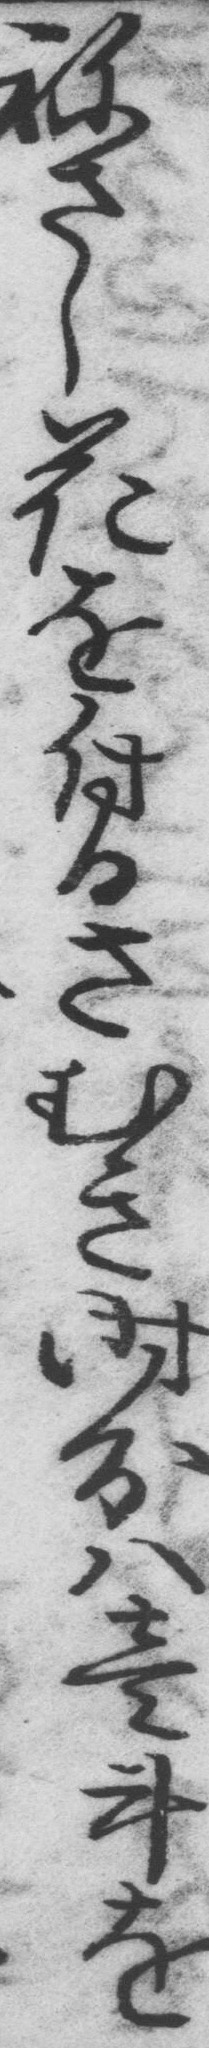ねさし花を付るさむき時分は壱斗を
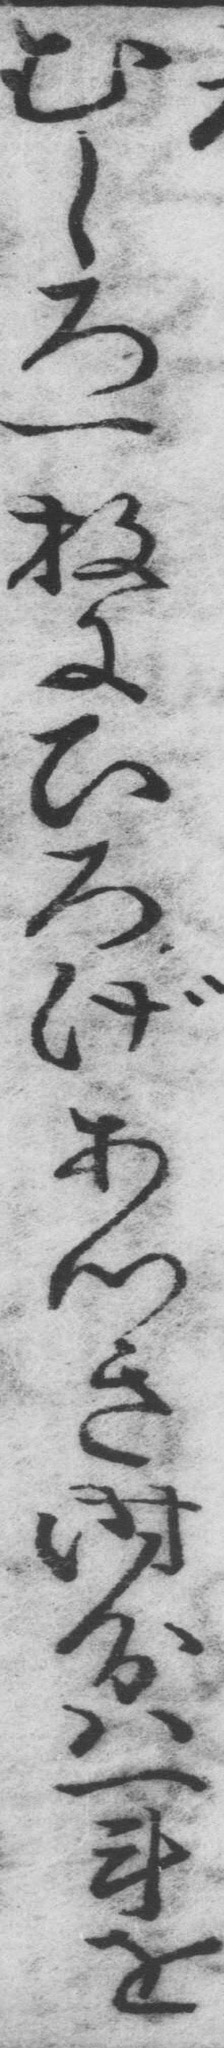むしろ一枚にひろげあつき時分は一斗を
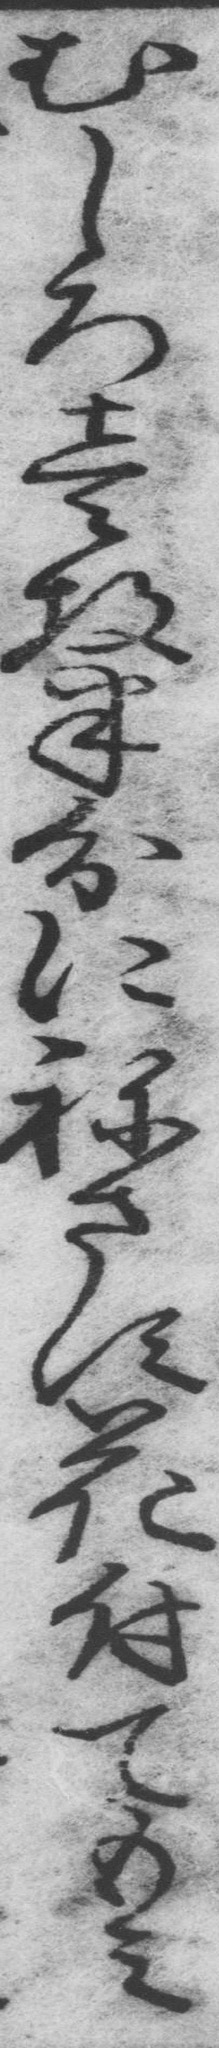むしろ壱枚半分にねさす花付てもみ
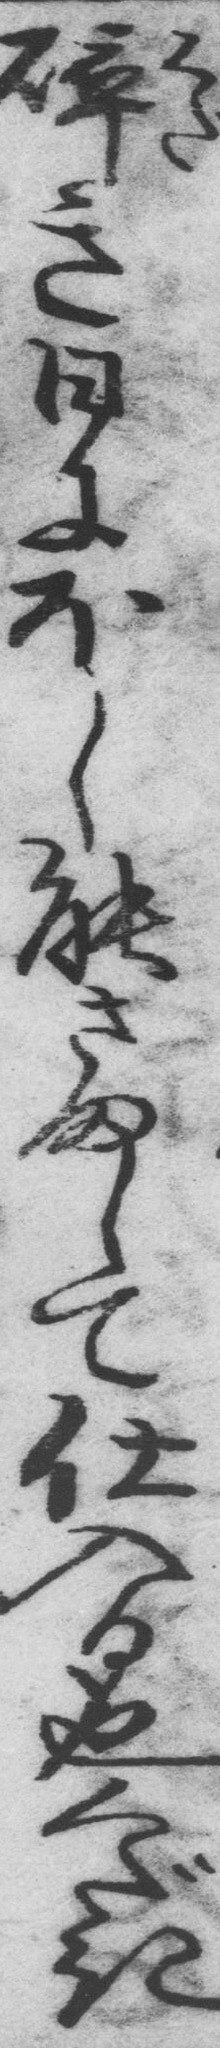砕き日にほし能さまして仕入る也くだき
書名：料理山海郷
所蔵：大阪府立大学学術情報センター 国文学研究資料館
